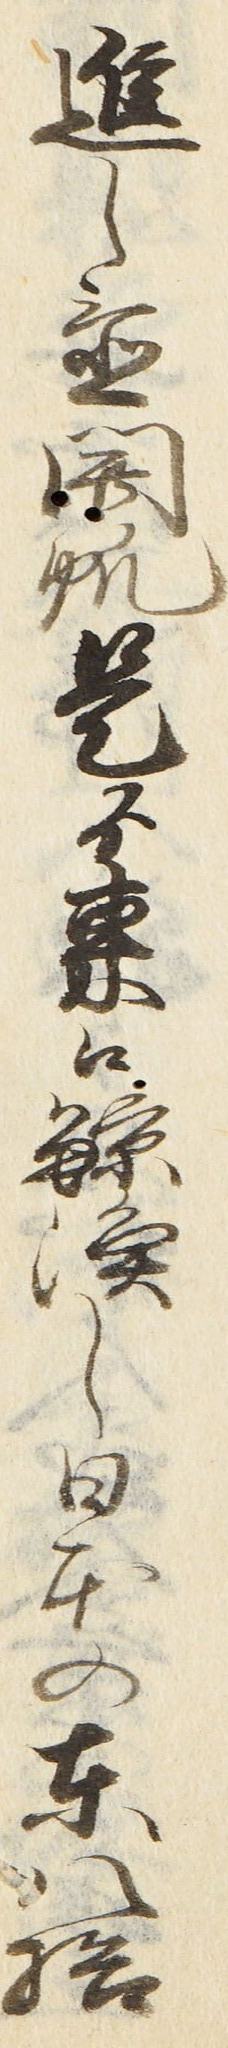進之置開帆是ゟ東江鯨漁し日本の東八拾
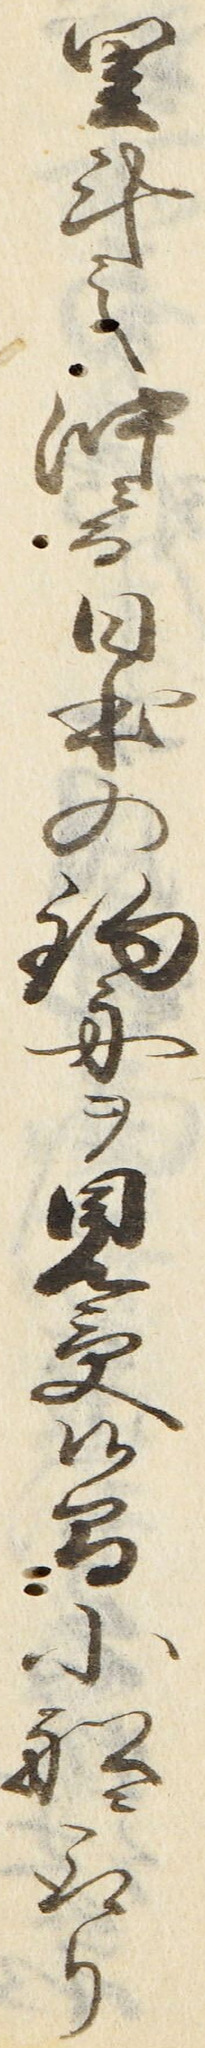里斗之沖ニ而日本の釣舟ヲ見受候間小舩ニ取り
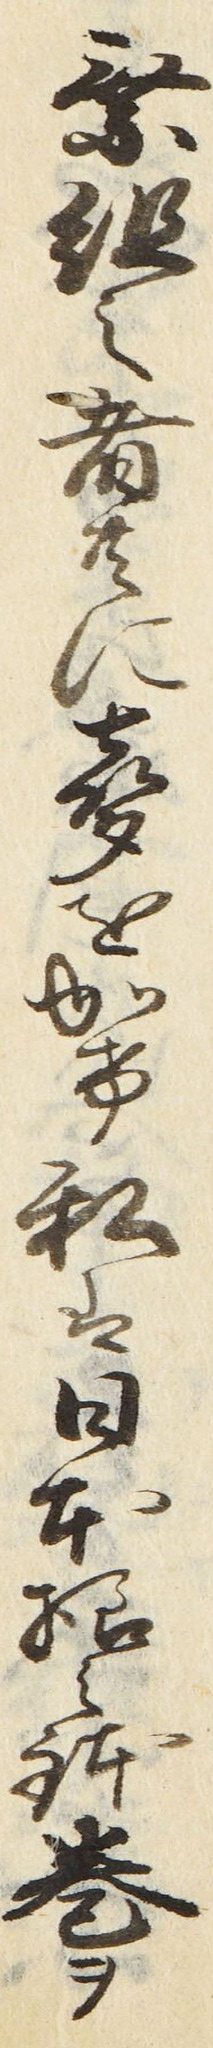乗組之者共に聲をかけ私は日本様之鉢巻ヲ
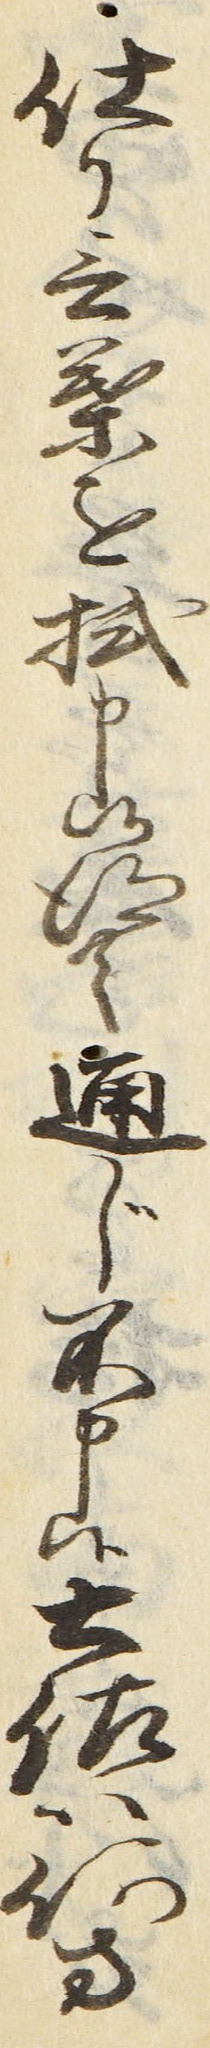仕り言葉を掛申候得共通じ不申候土佐ハ何方

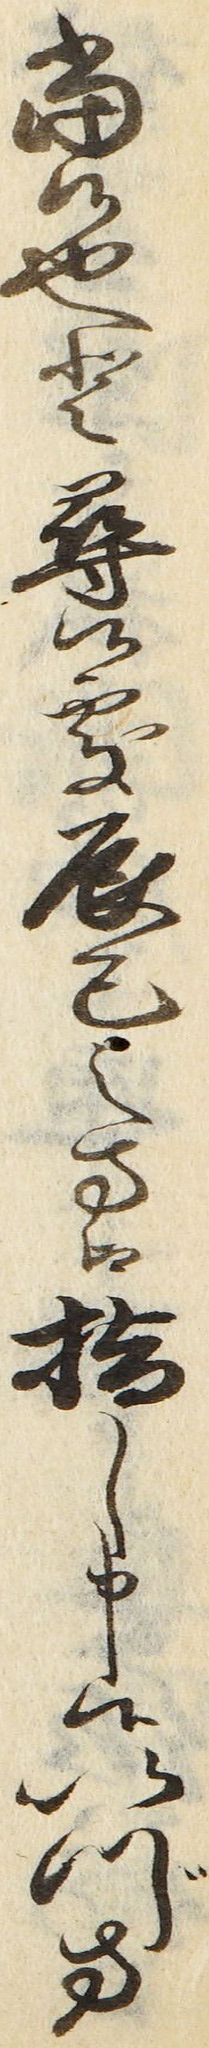當候也と尋候處辰巳之方江指し申候いづ方
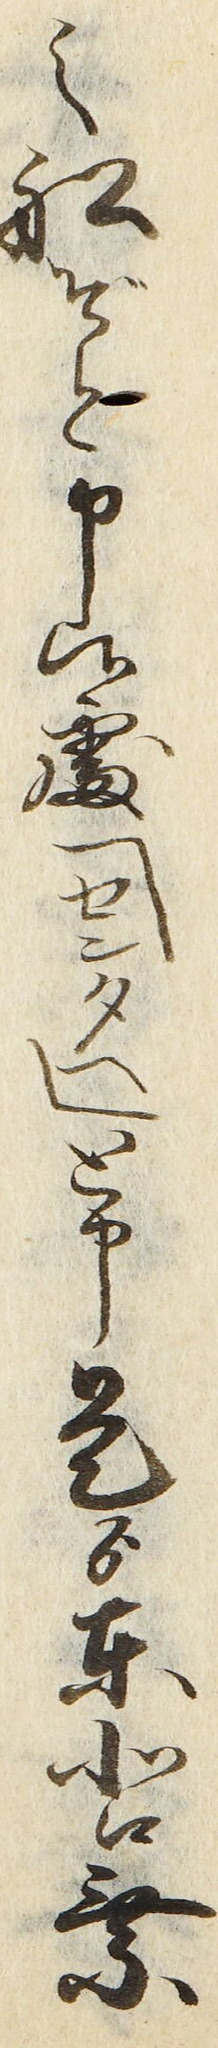之舩ぞと申候處「センタヘ」と申是ゟ東北江乗
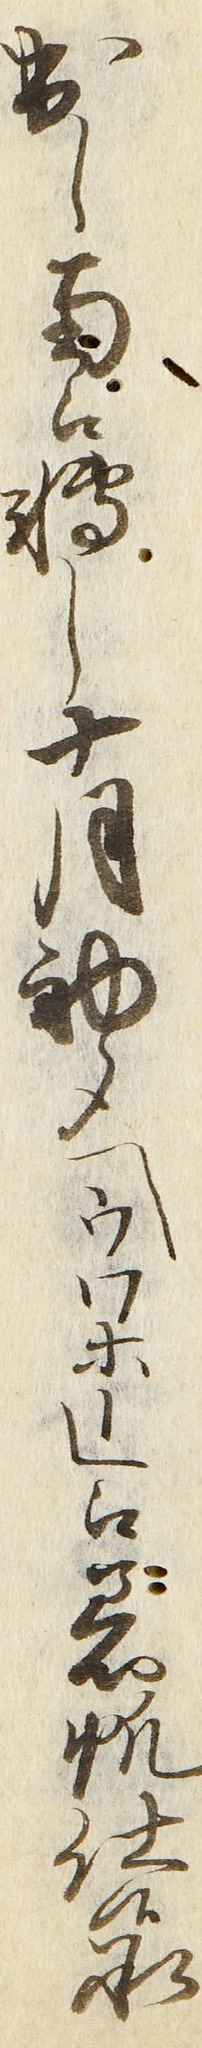出し南江轉し十月初メ「ウワホー」江着帆仕候承
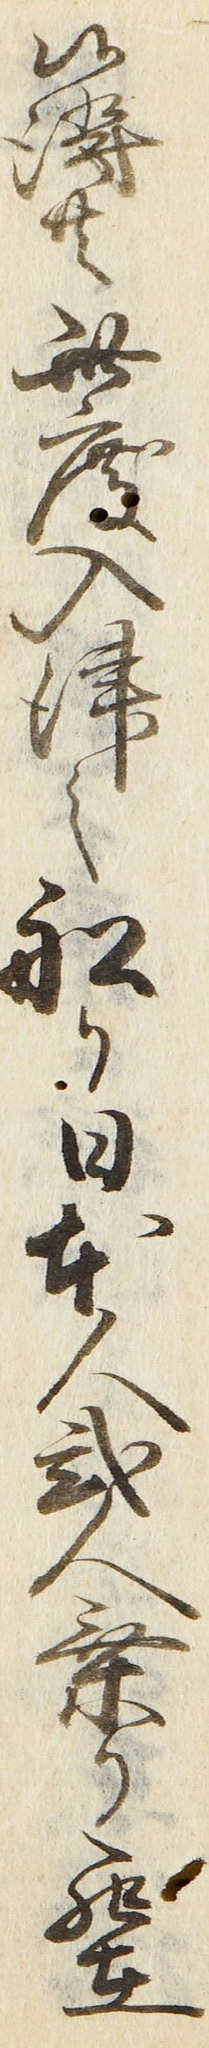候得共此度入津之舩に日本人弐人乗り罷在
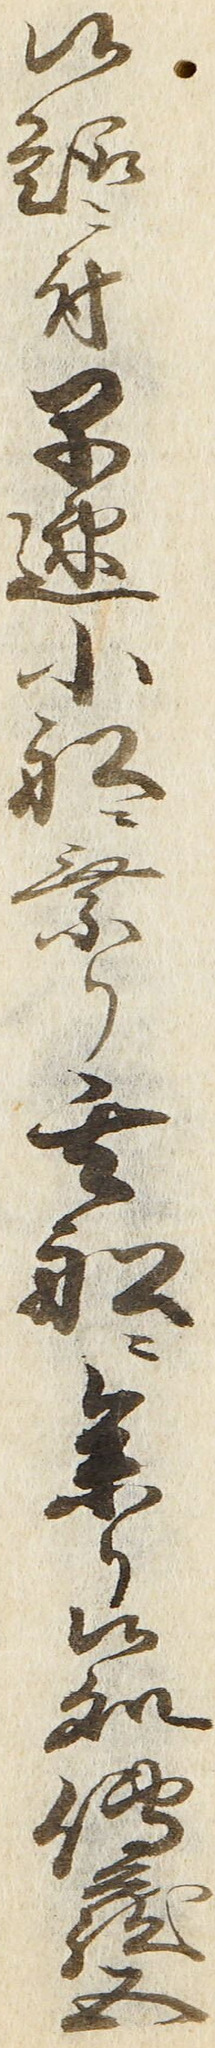候趣ニ付早速小舩ニ乗り其舩ニ参り候処傳蔵五
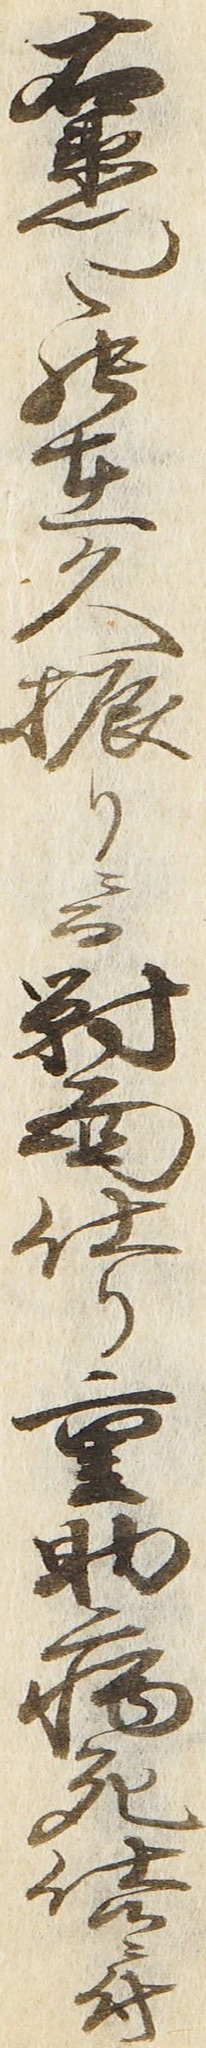右衛門罷在久振りニ而對面仕り重助病死仕候ニ付
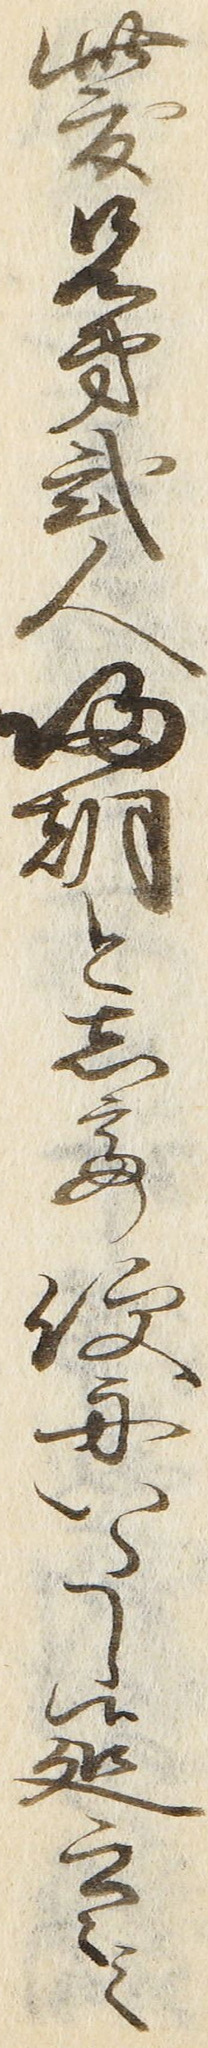此度兄弟弐人帰朝として便舟いたし候処云々之
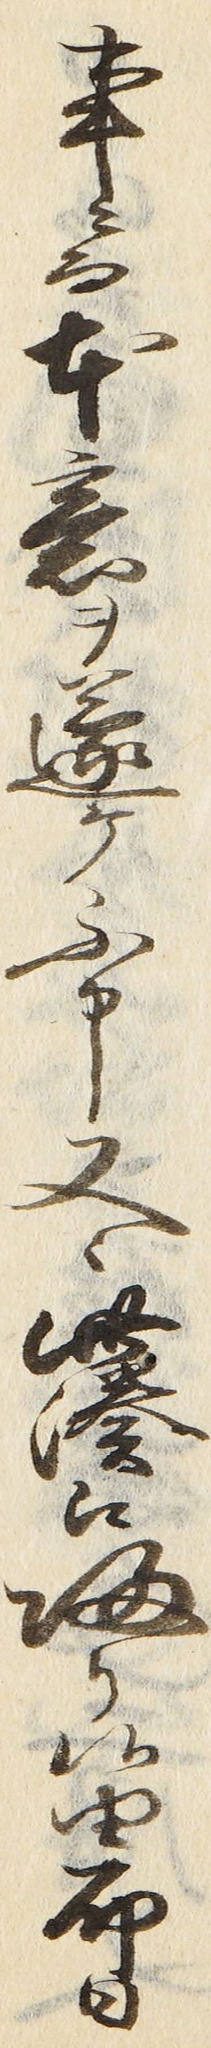事にて本意ヲ遂ケ不申又々此湊江帰り候由即日
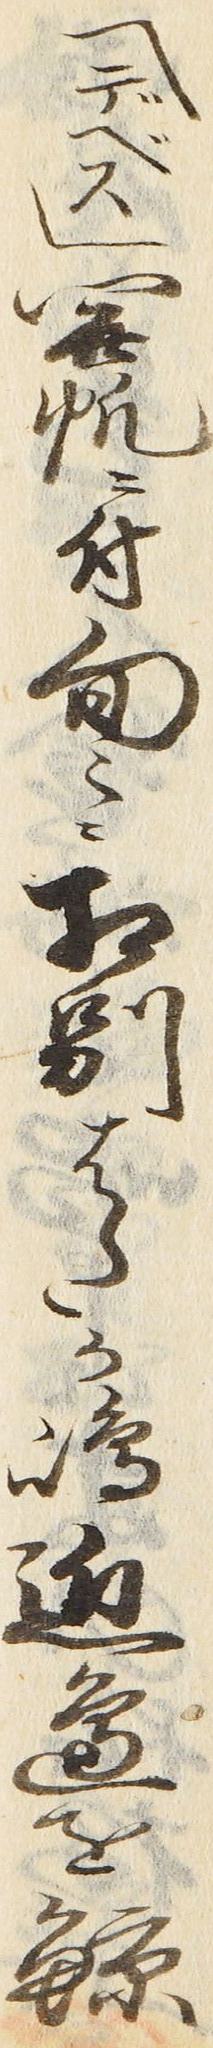「デべス」開帆ニ付旬々ニ相別はたか嶋近邊を鯨
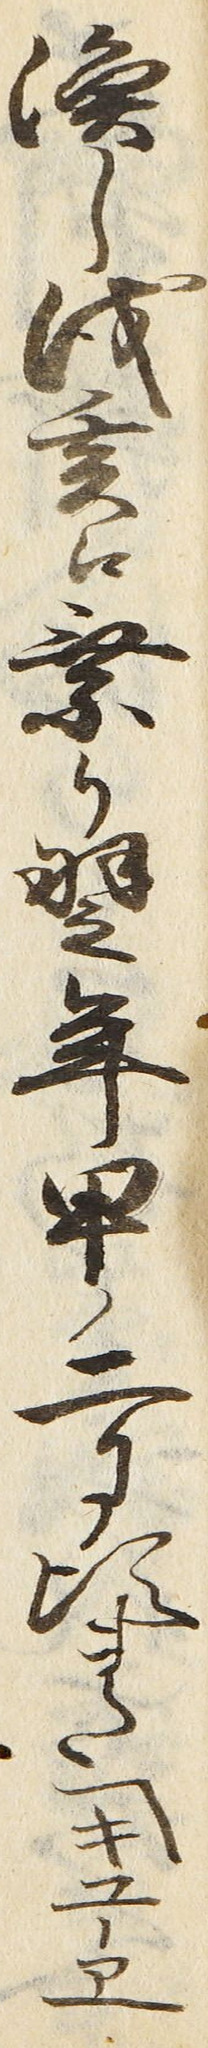漁し戌亥江乗り翌年申ノ二月頃また「キユーヱ
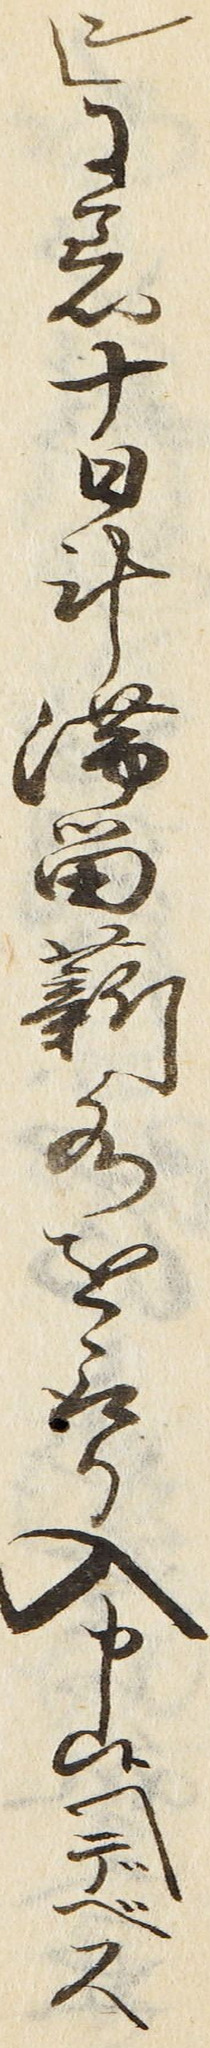ン」に着十日斗滞留薪水を取り入申候「デべス
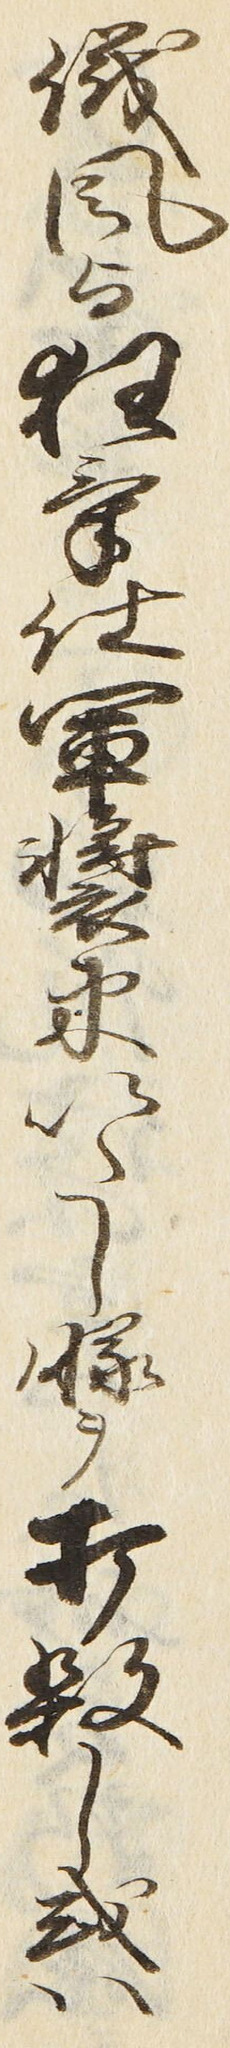俄風と狂氣仕軍装束いたし豚ヲ打殺し或ハ
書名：漂客談寄
